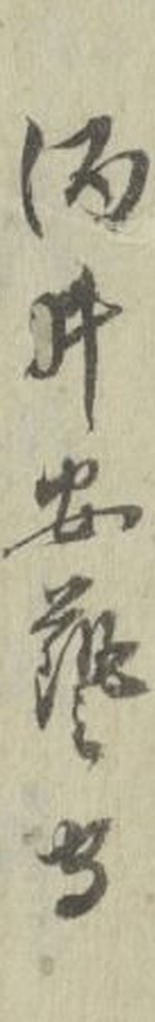大紋酒井安芸守
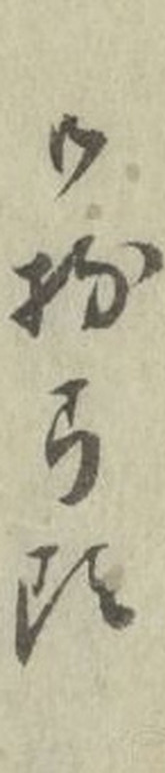御持弓頭
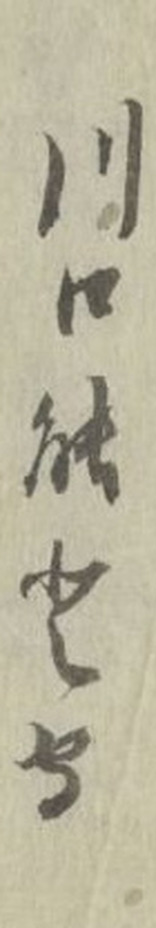大紋川口能登守

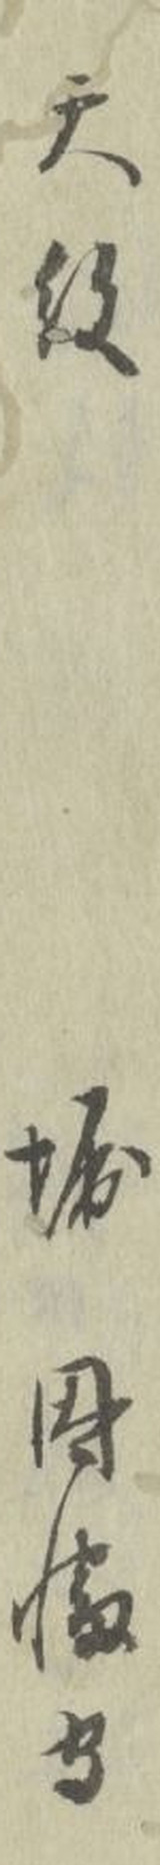大紋堀因幡守
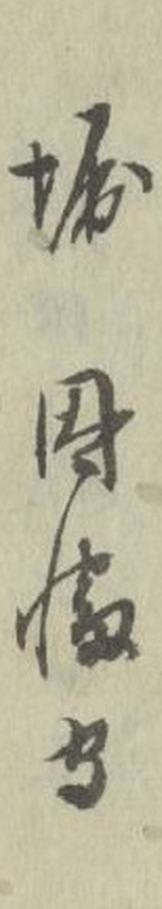大紋堀因幡守
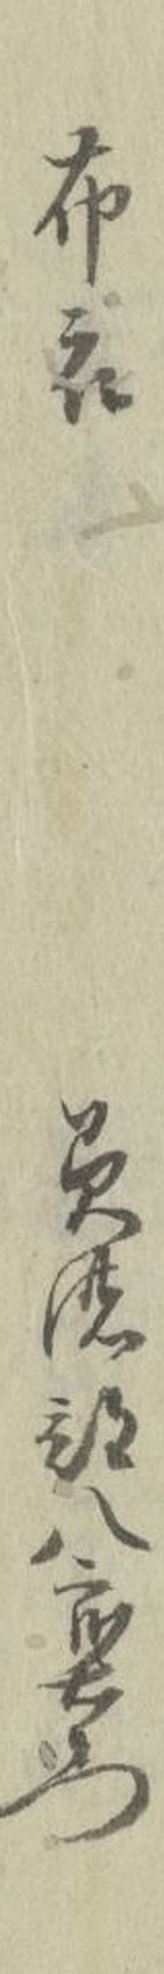布衣美濃部八郎右衛門
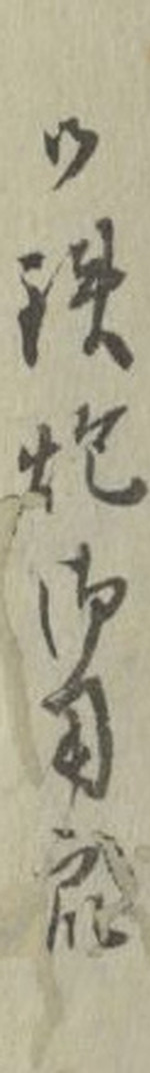御鉄炮御用衆
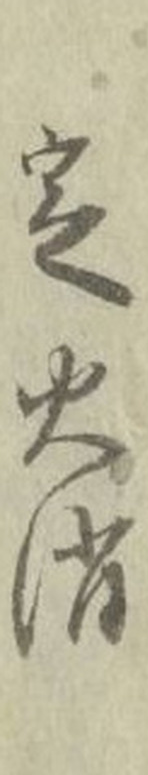定火消
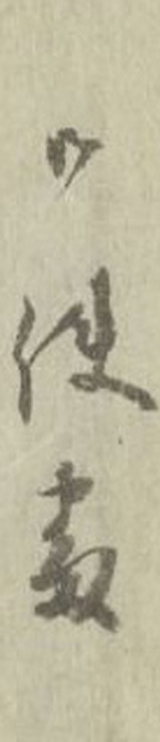御使番
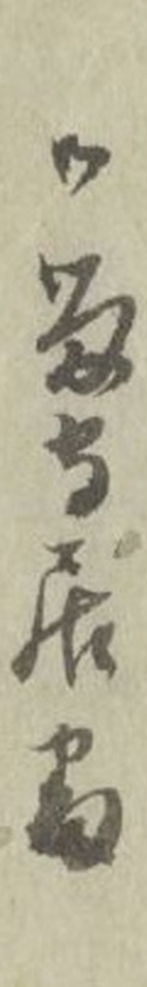御留守居番

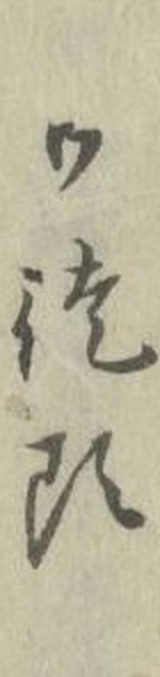御詫頭
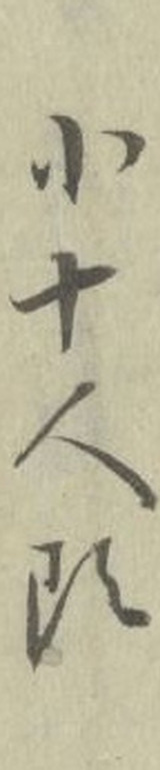小十人頭
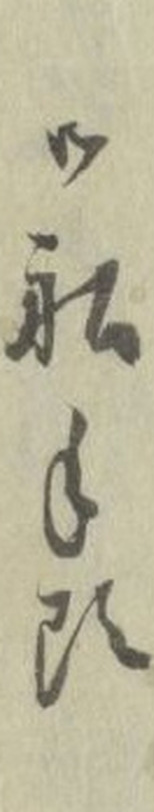御船手頭
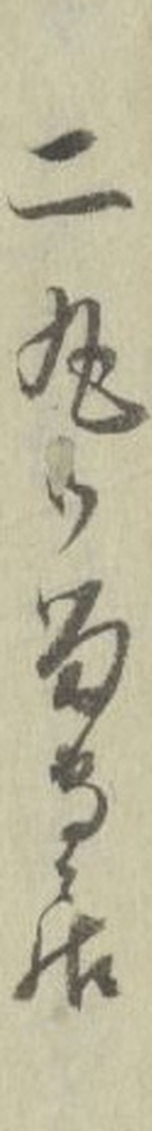二丸御留守居
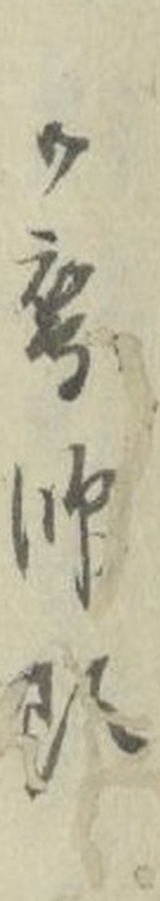御高師頭
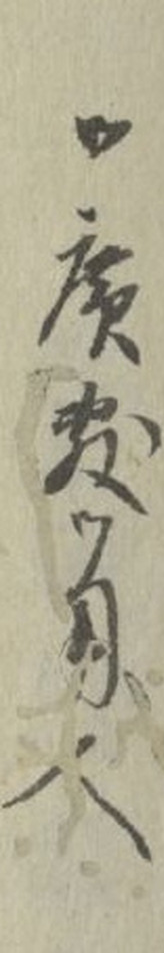御広敷御用人
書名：琉球来朝記 自一至七
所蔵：University of the Ryukyus Library
